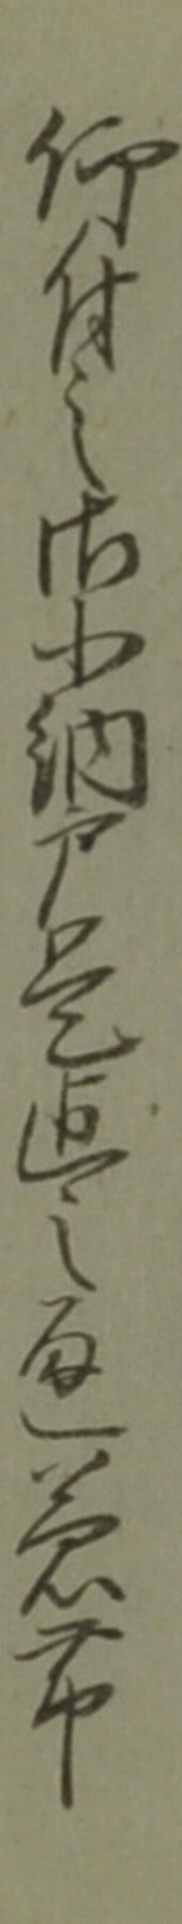仰付之御小納戸是迄之通兼帯
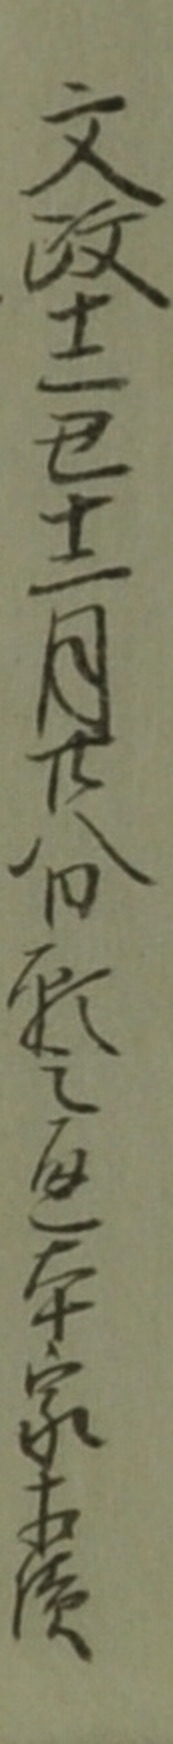文政十二丑十二月廿八日願之通本家相続
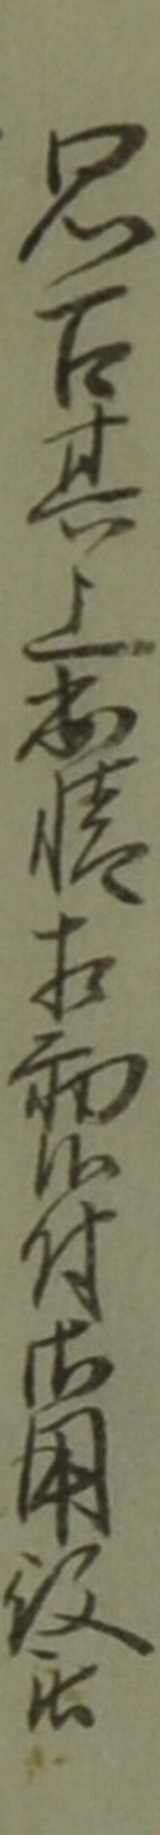思召其上出情相勤候付御用役被
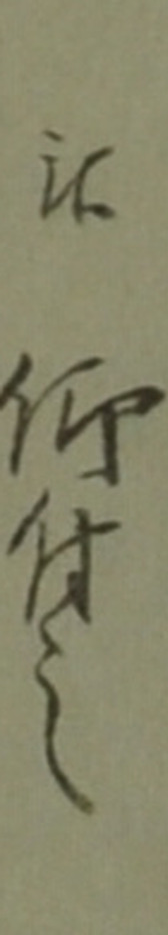被仰付之
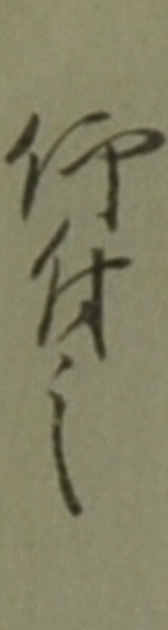仰付之
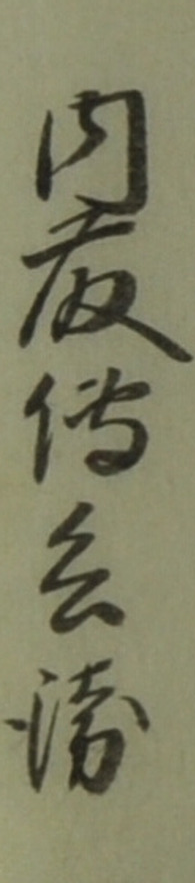内藤伝兵衛

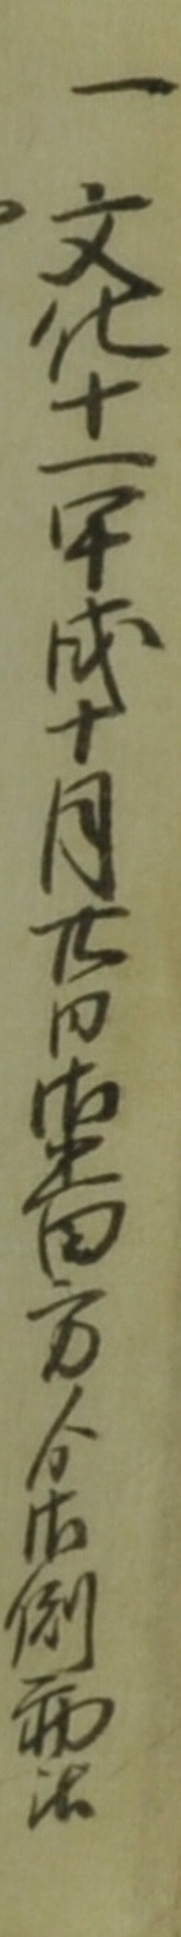一文化十一甲戌十月廿日御番方ゟ御側被
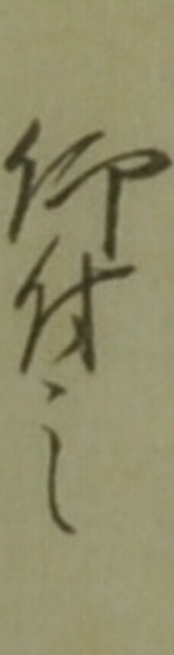仰付之
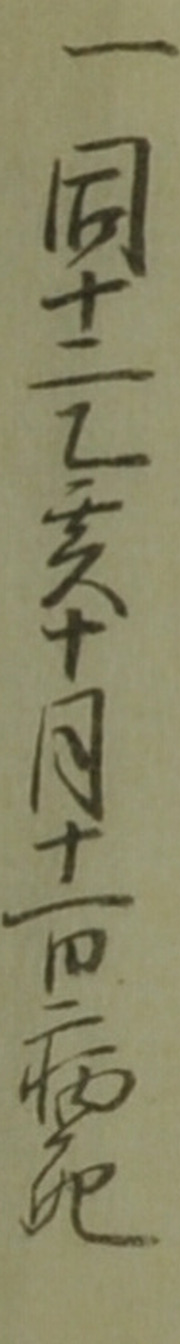一同十二乙亥十月十一日病死
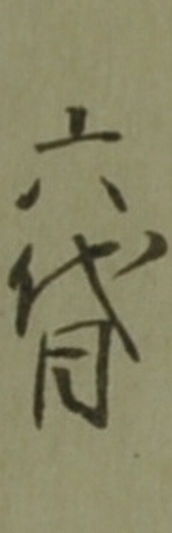六代目
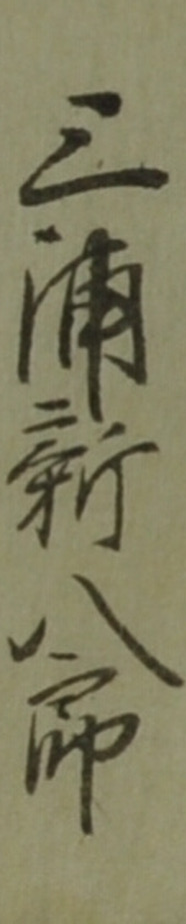三浦新八郎
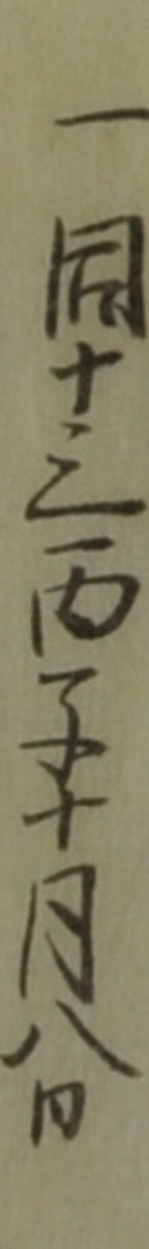一同十三丙子十月八日
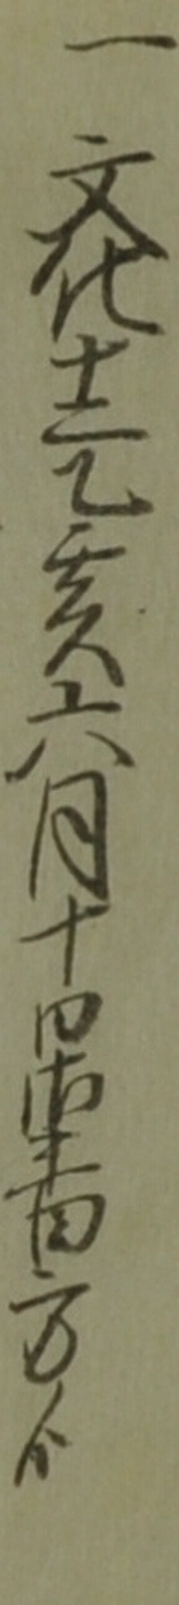一文化十二乙亥六月十日御番方ゟ
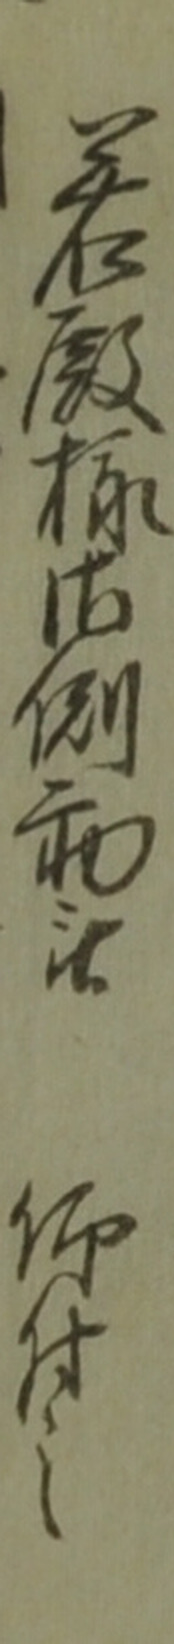若殿様御側勤被仰付之
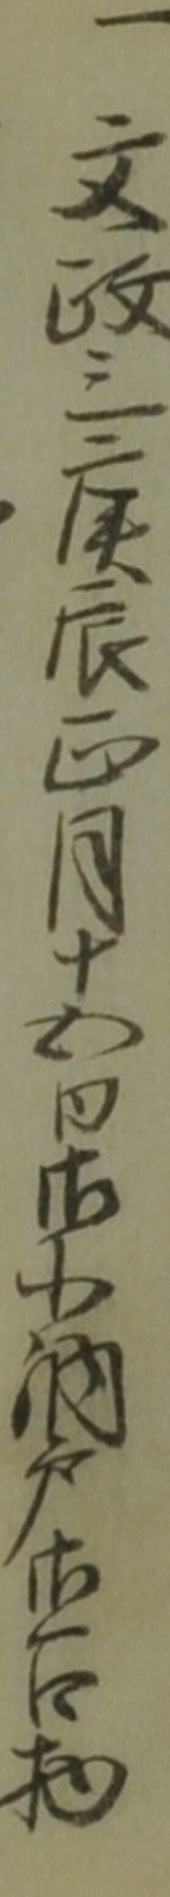一文政三庚辰正月十五日御小納戸御召物
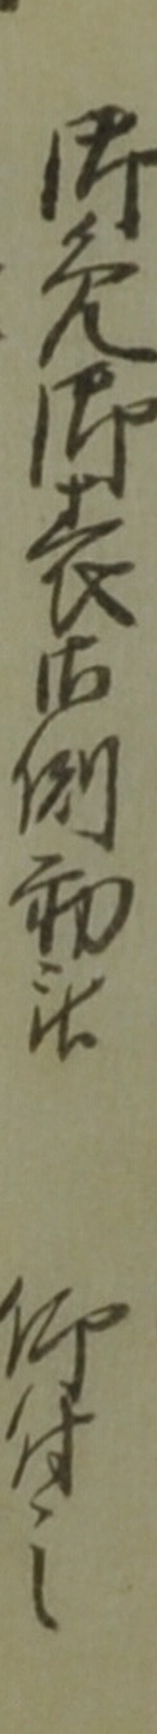御免御表御側勤被仰付之
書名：諸御役代々録（五）
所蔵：伊那市立高遠町図書館・合同会社AMANE
